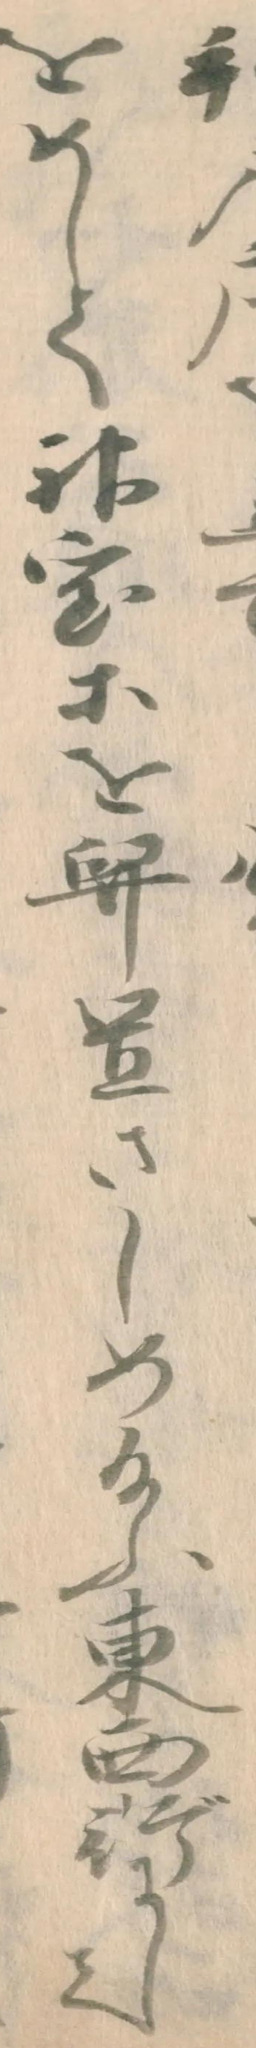をめして神宝等を舁置さしめ給ふ東西-行にして
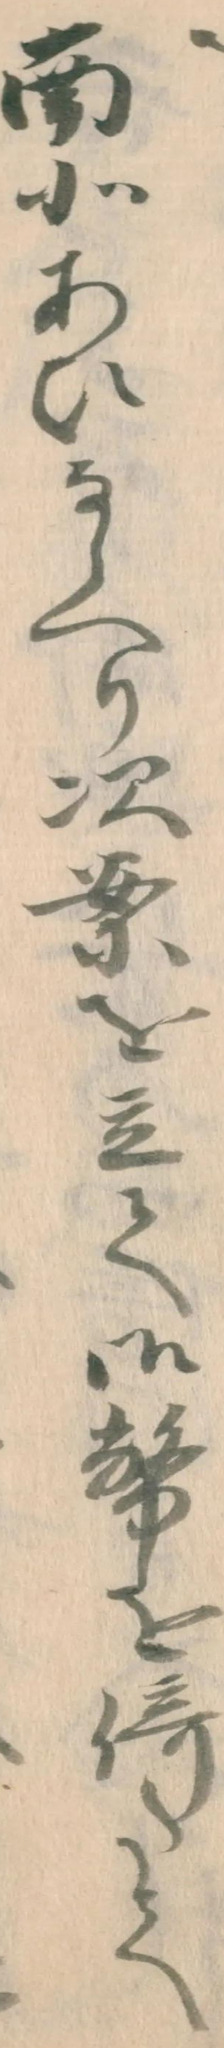南北あひならへり次案を立て御幣を倚たて
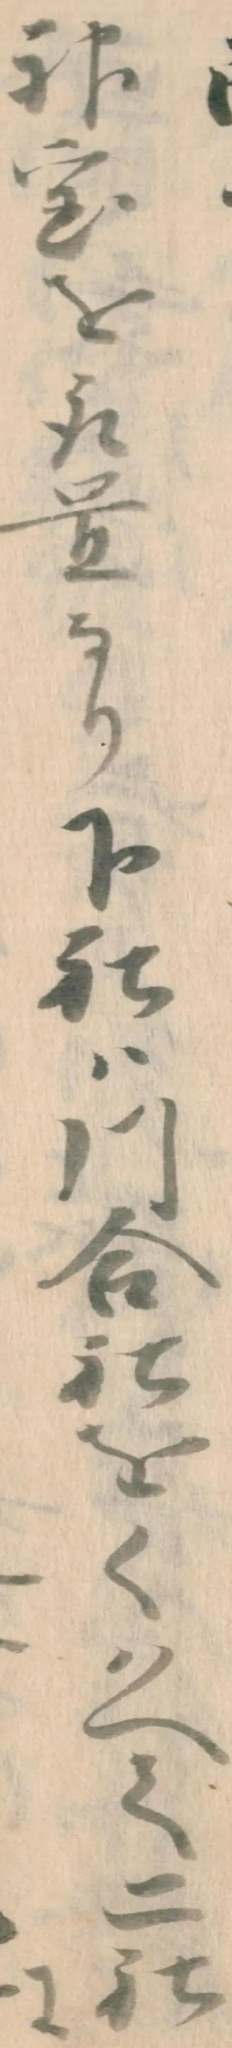神宝を取置なり下社は川合社をくはへて二社に
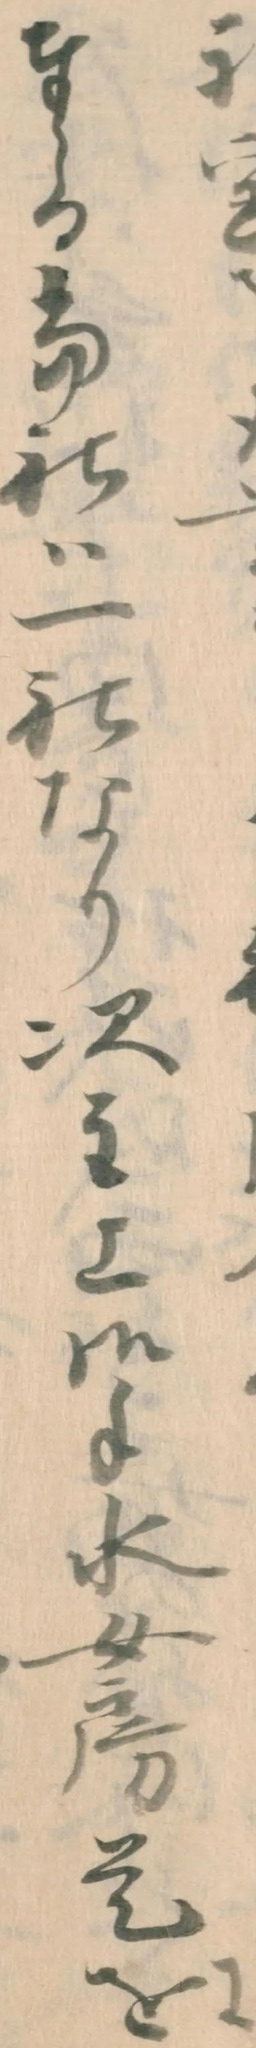奉らる当社は一社なり次主上御手水女房是を
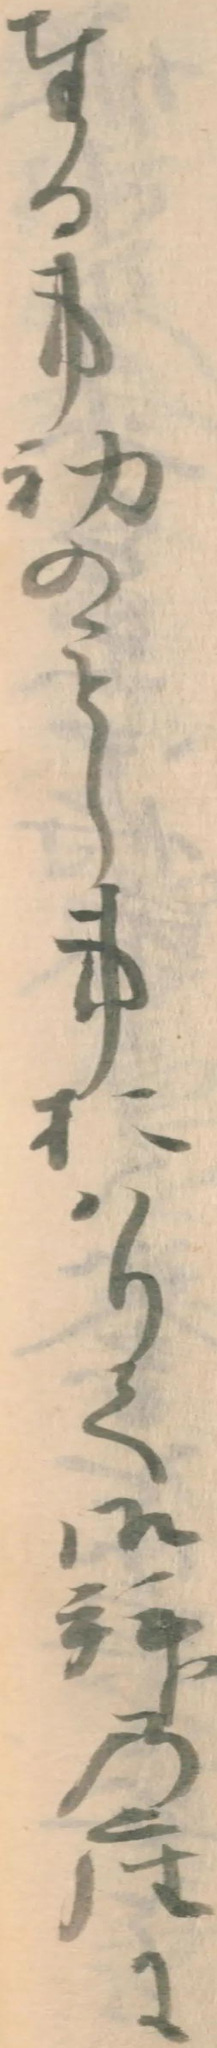奉る事初のことし事おはりて御拝の座に
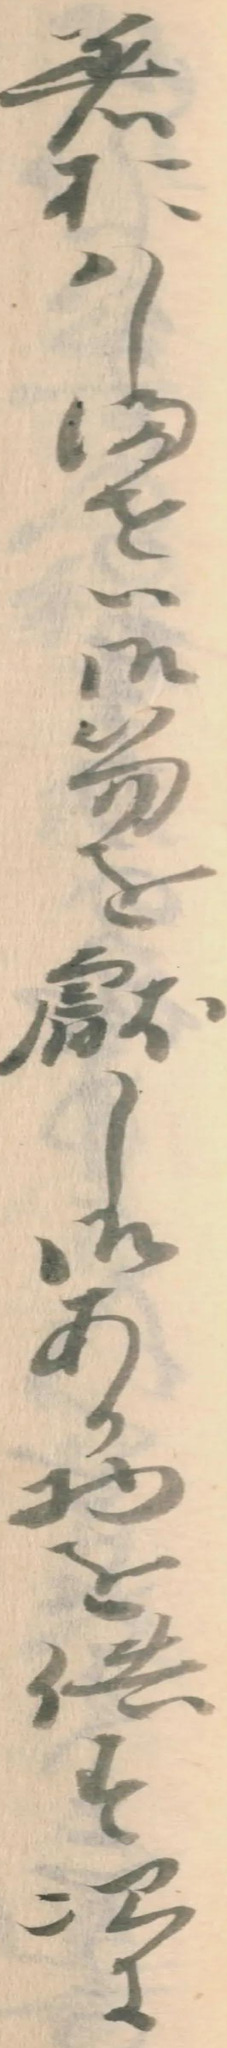着おはしませは御笏を献し御あか物を供す次に
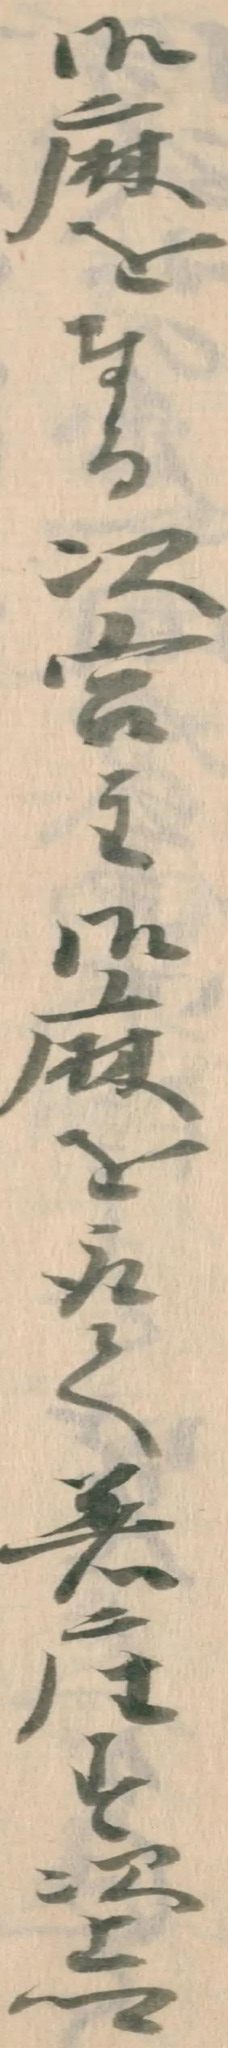御麻を奉らる次宮主御麻を取て着座す次上卿
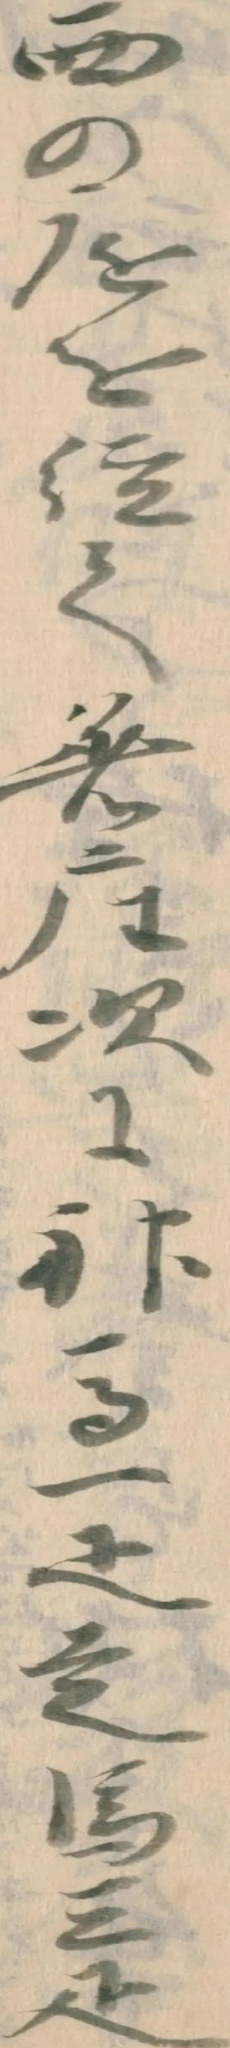西の庭を経て着座次に神馬一疋走馬三疋
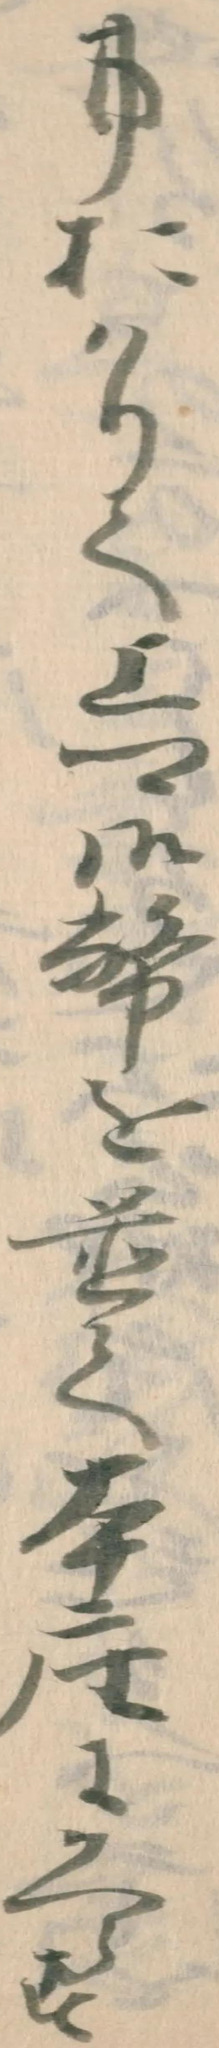事おはりて上卿御幣を並て本座にかへらす
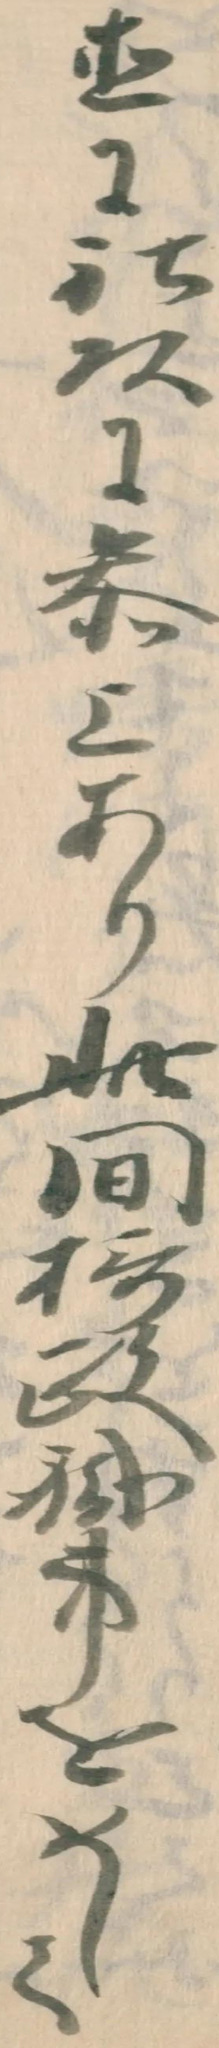直に社頭に参上あり此間摂政職事をめして
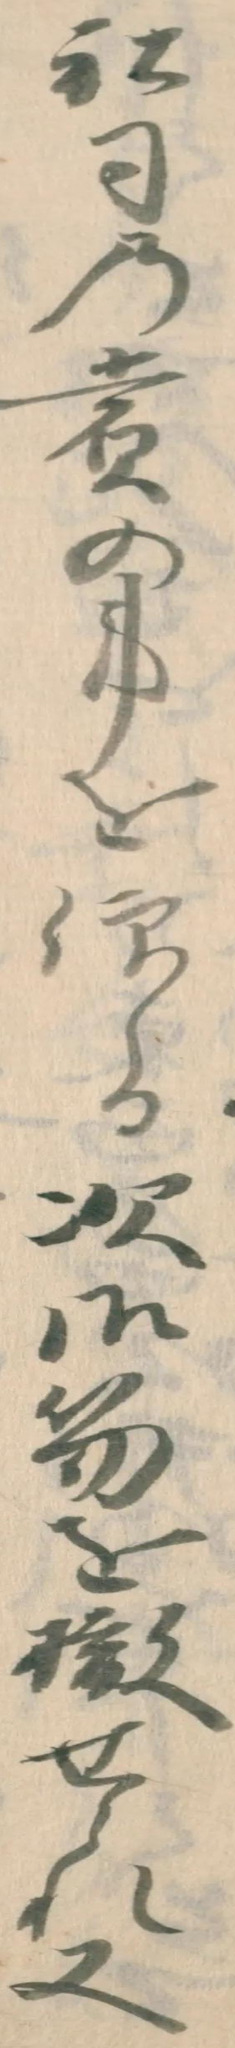社司の賞の事を仰らる次御笏を撒せられ又
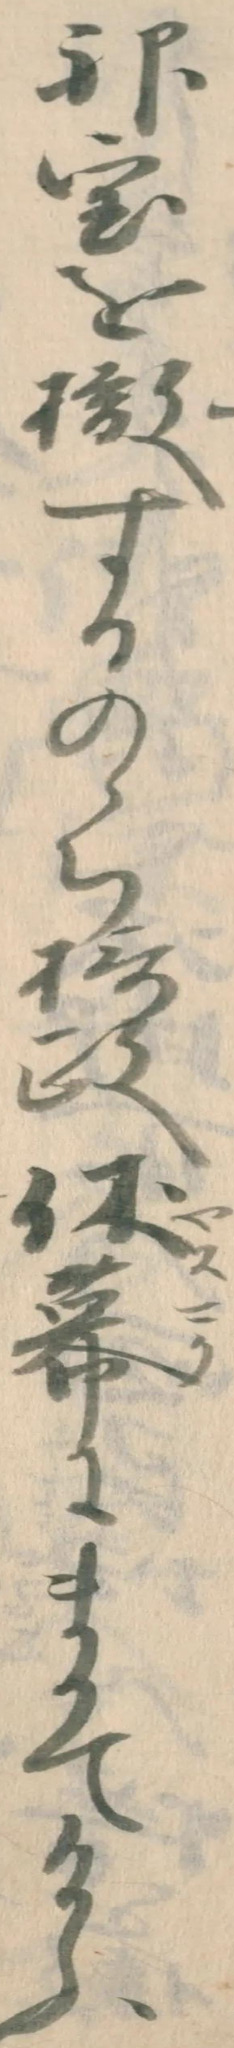神宝を撤するのゝち摂政休幕にまかて給ふ
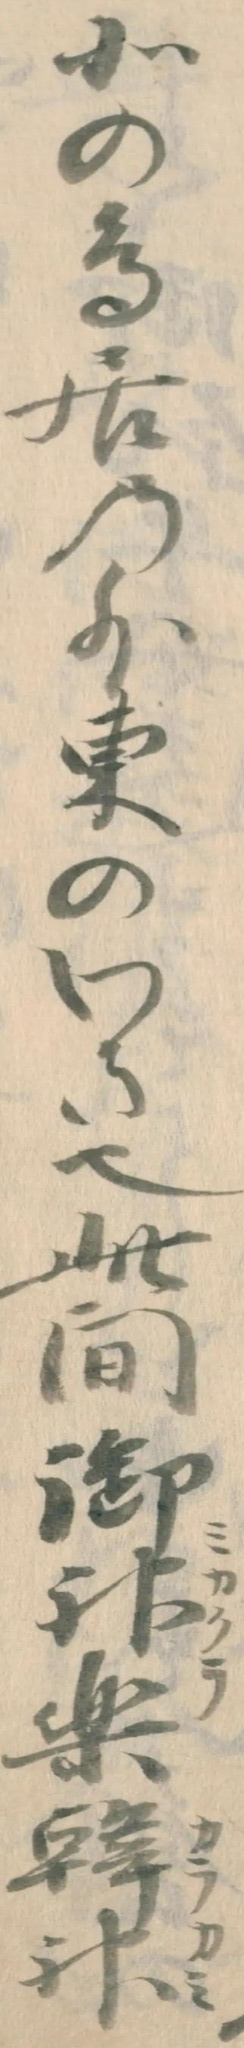北の鳥居の外東のわき也此間御神楽韓神
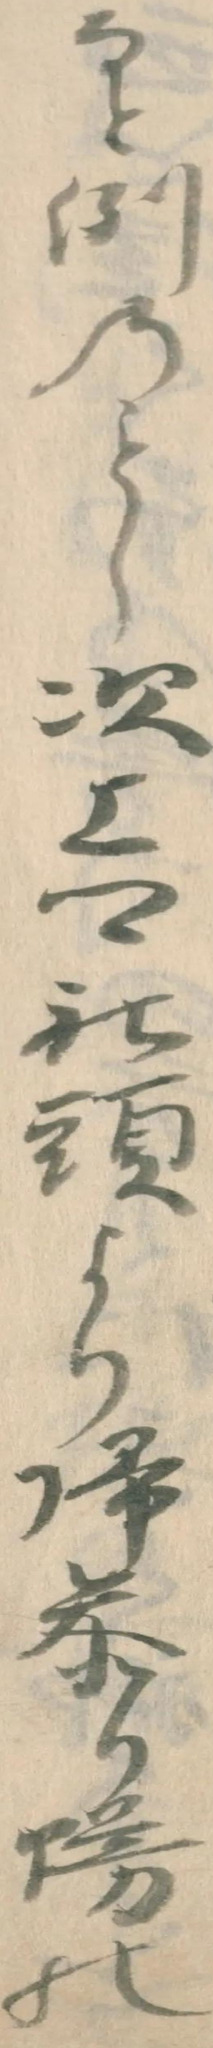なと例のことし次上卿社頭より帰参り幔の

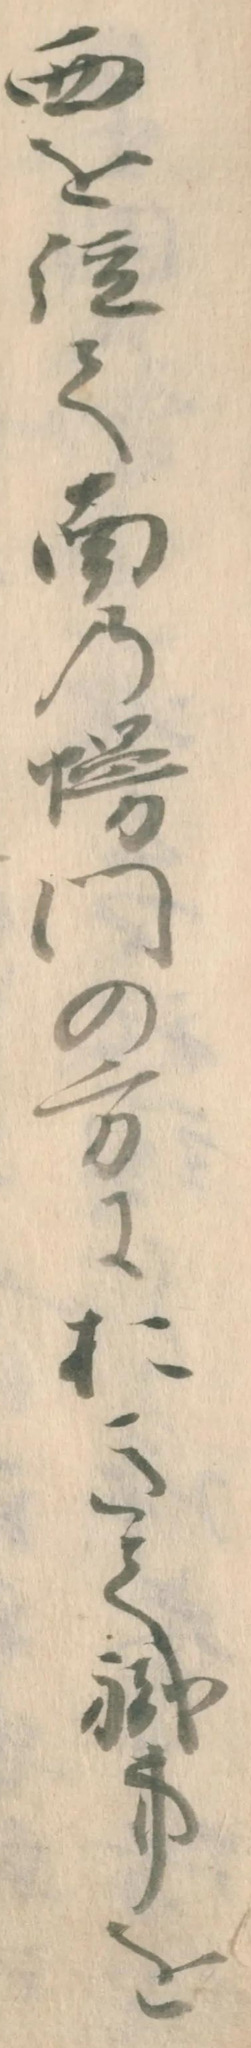西を経て南の幔門の方におきて職事を
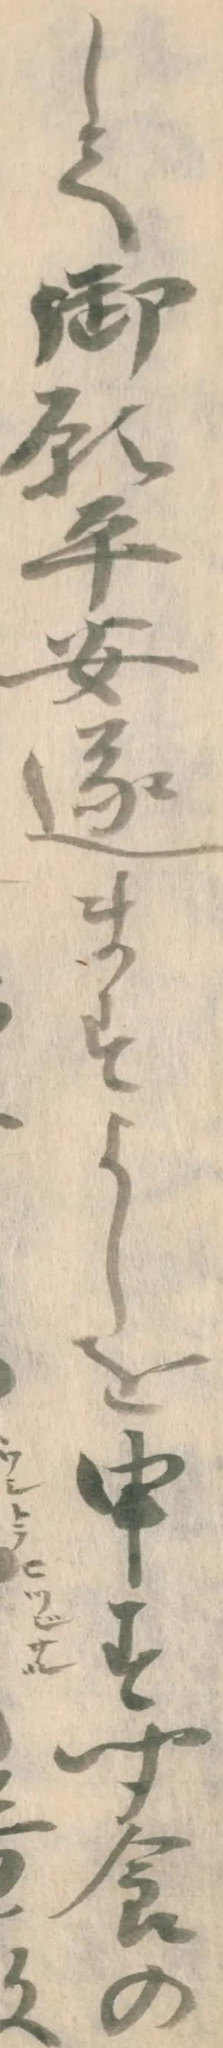して御願平安遂ますよしを申す聞食の
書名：賀茂社記録. 第1冊
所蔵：国立国会図書館 National Diet Library, JAPAN
